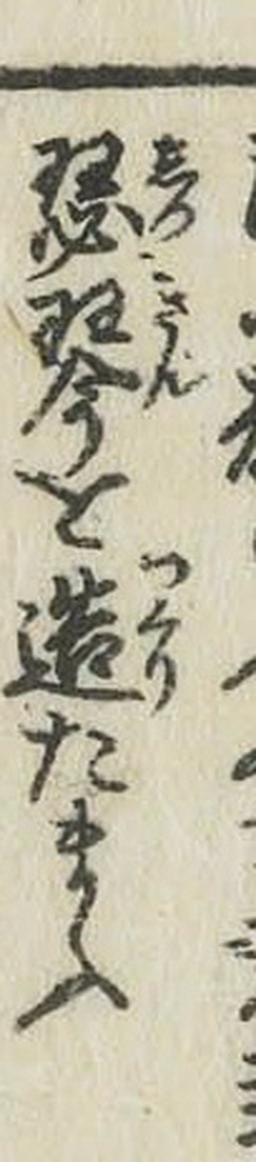瑟琴を造たまふ
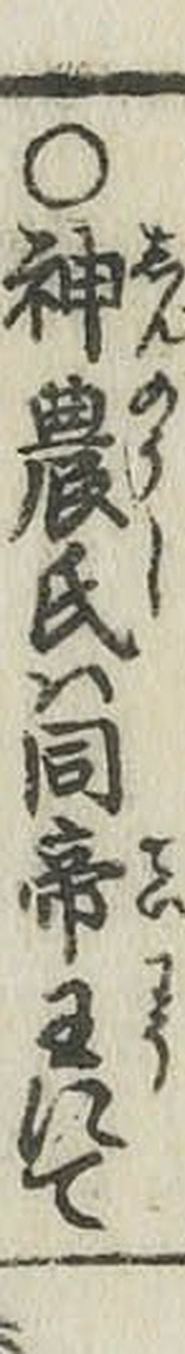○神農氏は同帝王にて
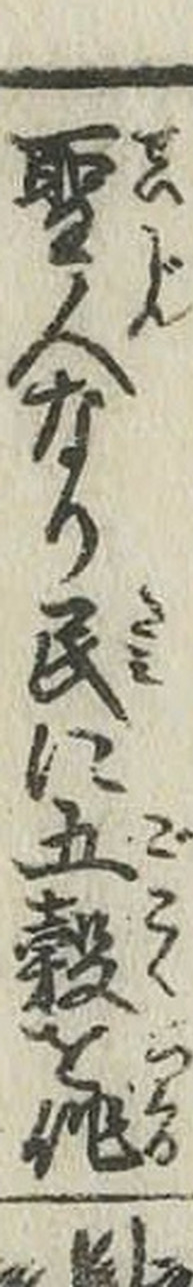聖人なり民に五穀を作
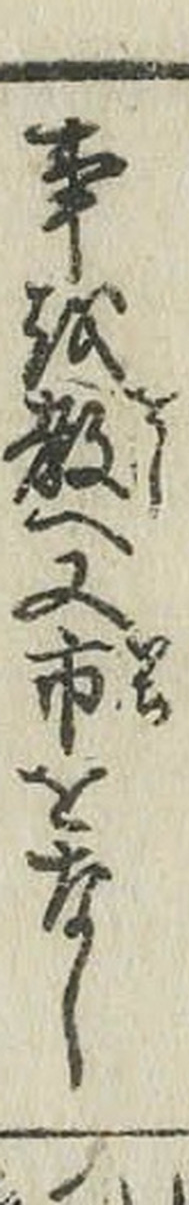事を教へ又市をなし
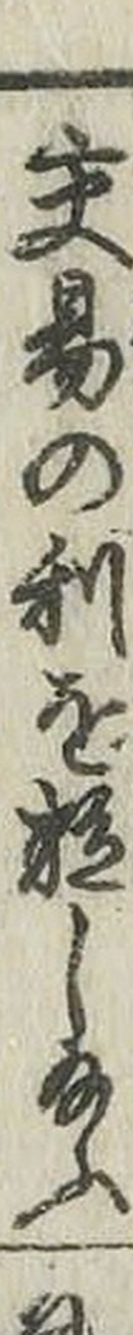交易の利を施し給ふ
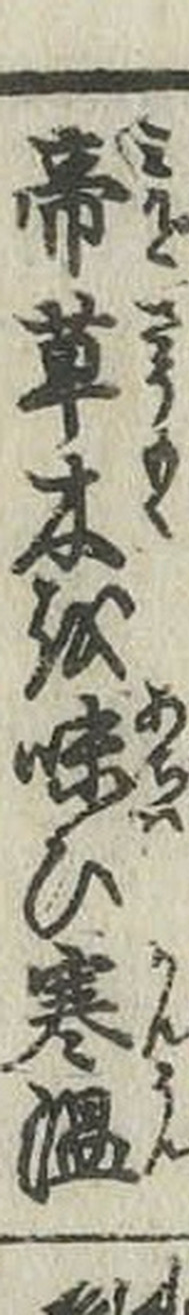帝草木を味ひ寒温
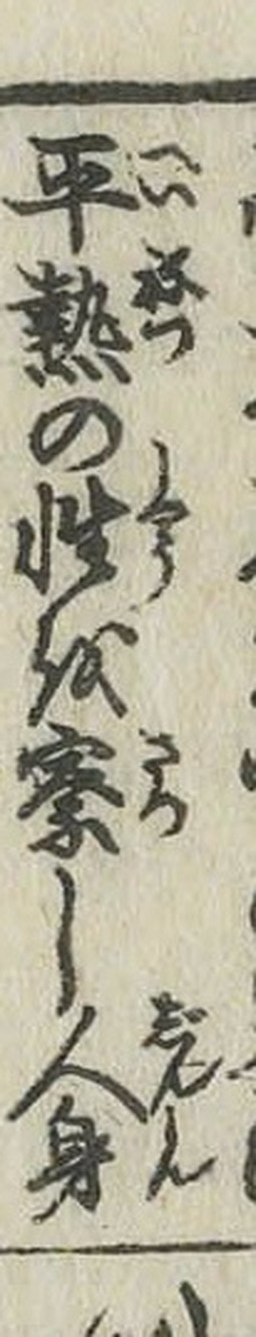平熱の性を察し人身
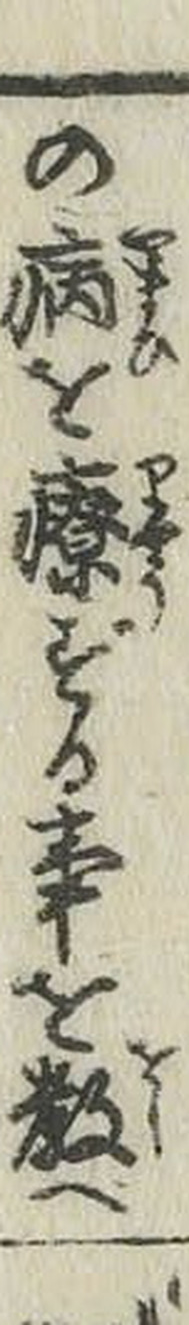の病を療ずる事を教へ
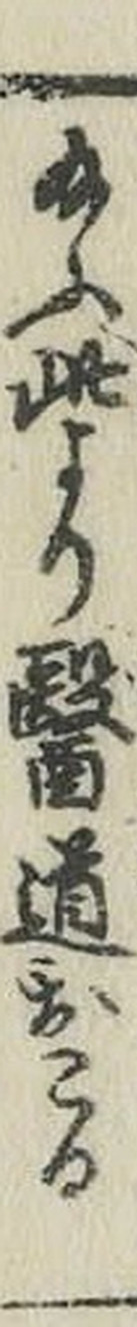給ふ此より医道おこる

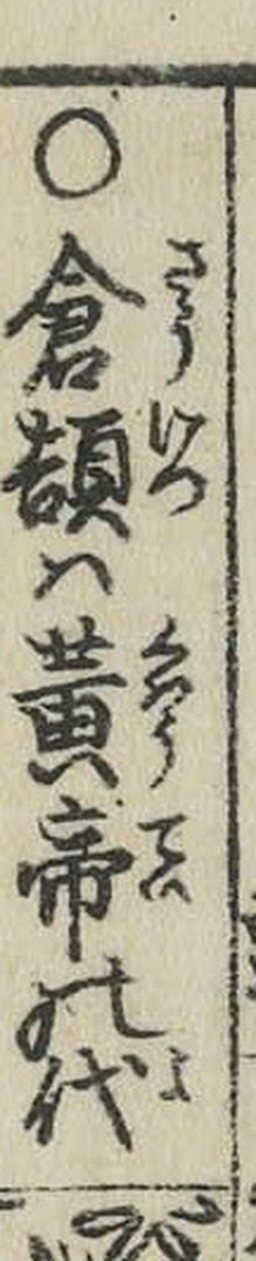○倉頡は黄帝の代
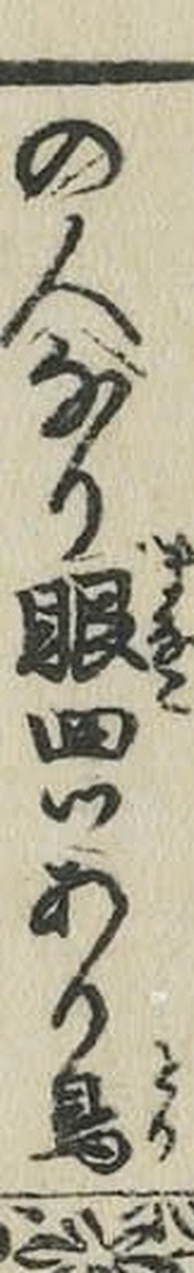の人なり眼四つあり鳥
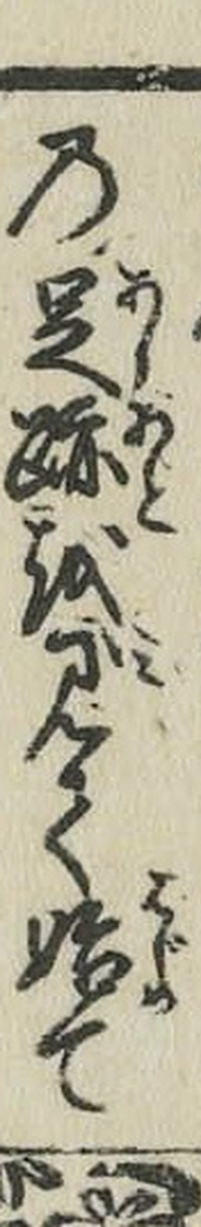の足跡を見て始て
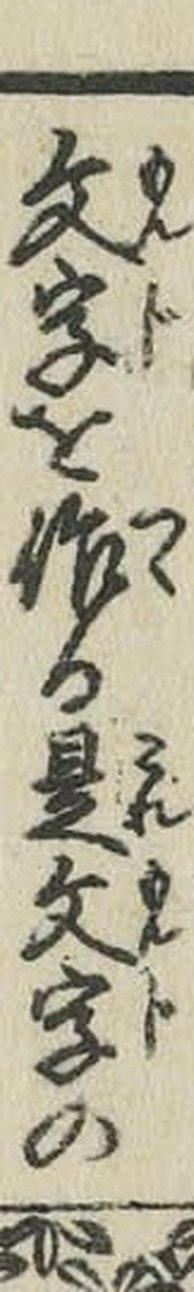文字を作る是文字の
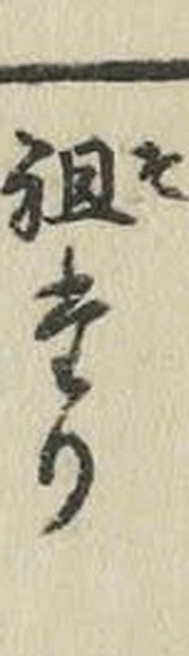祖なり
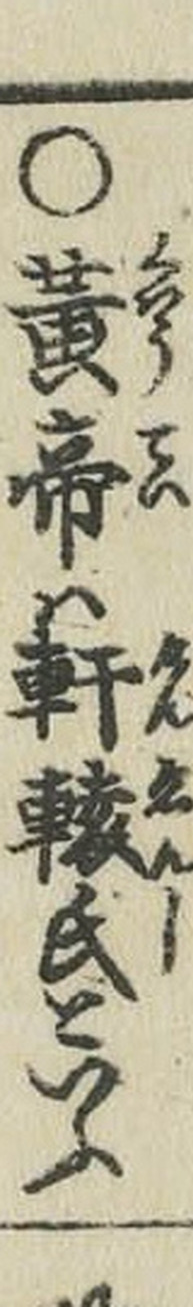○黄帝は軒轅氏といふ
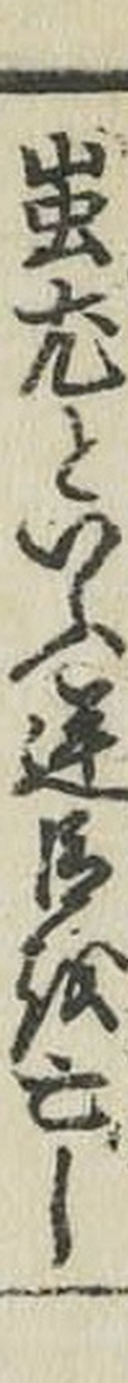蚩尤といふ逆臣を亡し
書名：増補頭書訓蒙図彙大成 10巻 10:巻之21
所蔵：東京学芸大学教育コンテンツアーカイブ
